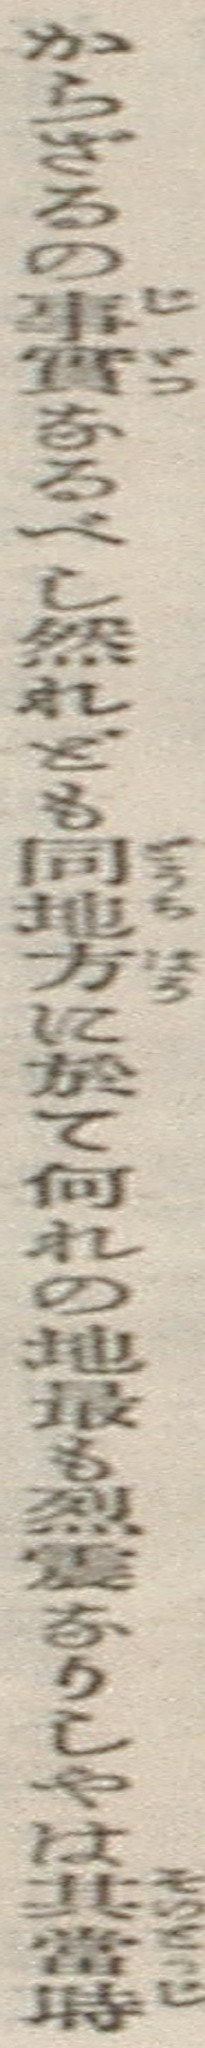からざるの事実なるべし然れども同地方に於て何れの地最も烈震なりしやは其当時
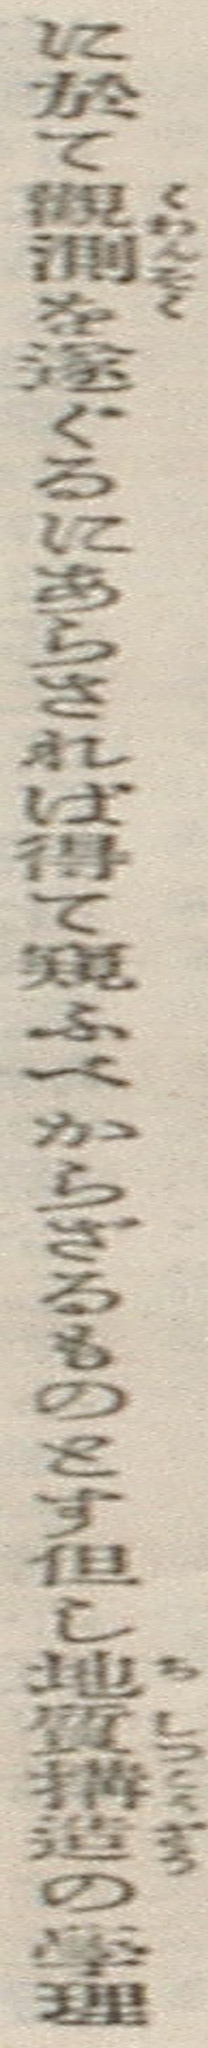に於て観測を遂ぐるにあらざれば得て窺ふべからざるものとす但し地質搆造の学理
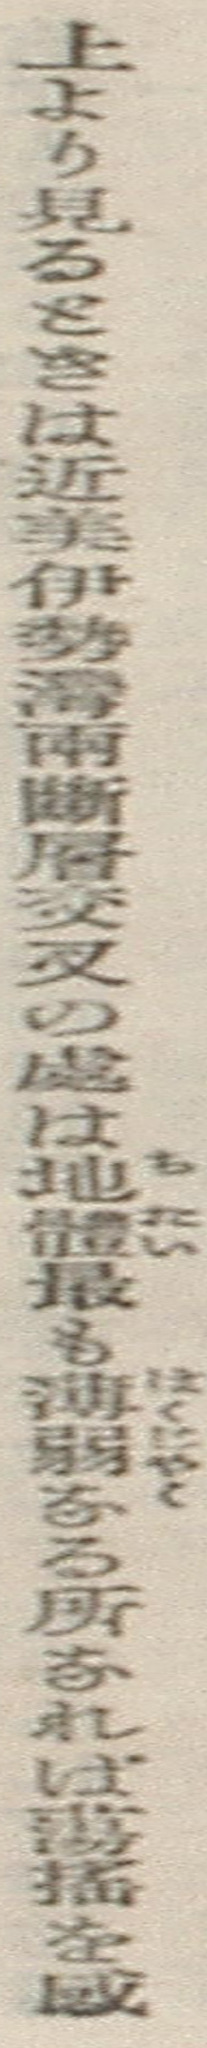上より見るときは近美伊勢湾両断層交叉の処は地体ちたい最も薄弱なる所なれば蕩揺を感
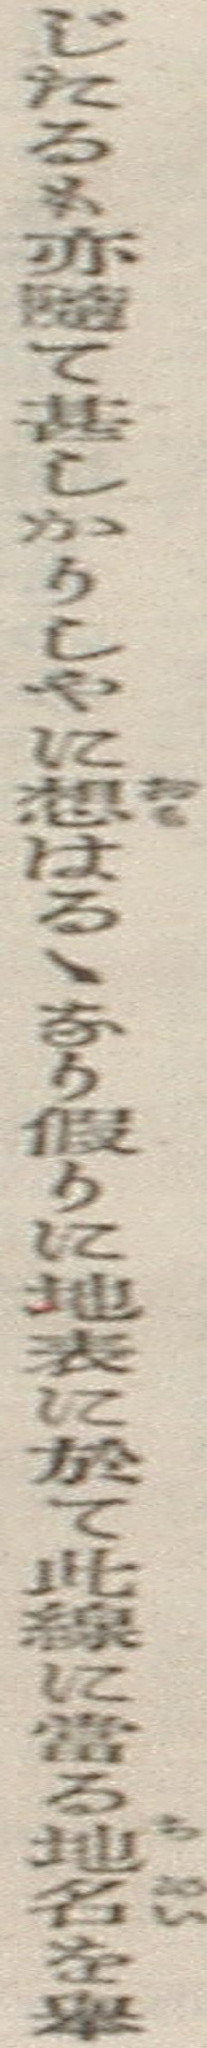じたるも亦随て甚しかりしやに想はるゝなり仮りに地表に於て此線に当る地名を挙
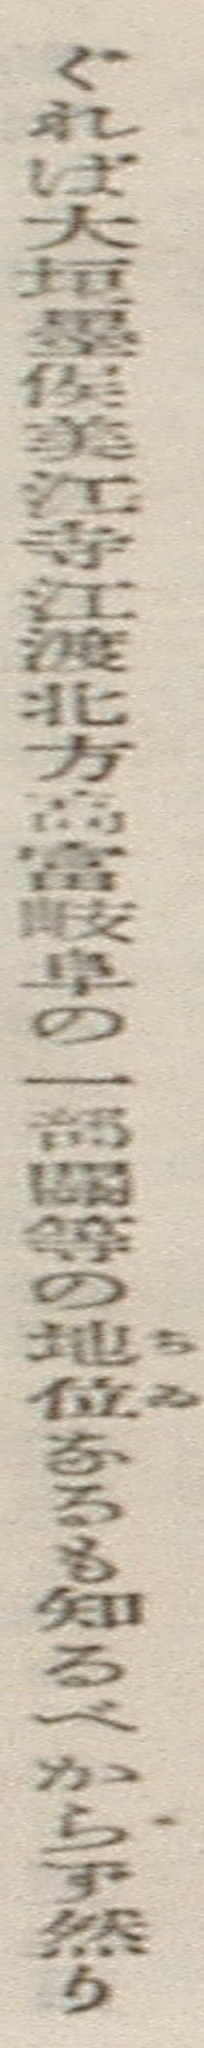ぐれば大垣墨俣美江寺江渡北方高富岐阜の一部関等の地位なるも知るべからず然り
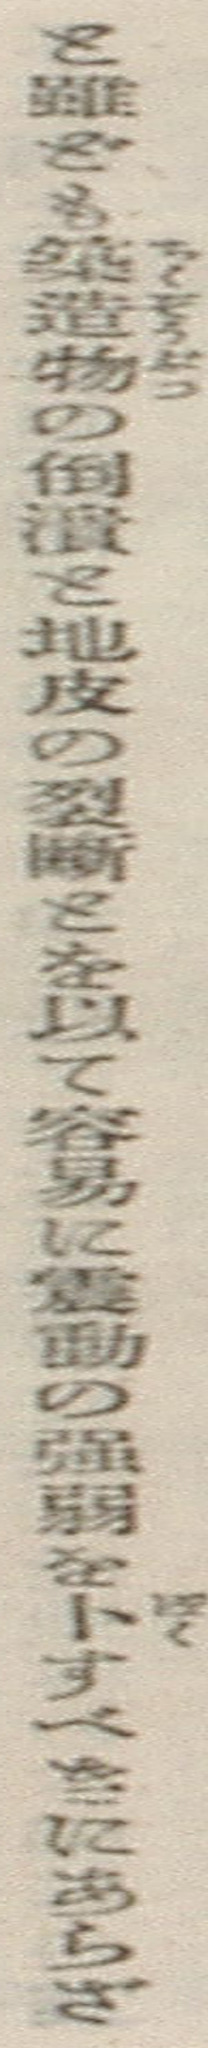と雖ども築造物の倒潰と地皮の裂断とを以て容易に震動の強弱を卜すべきにあらざ
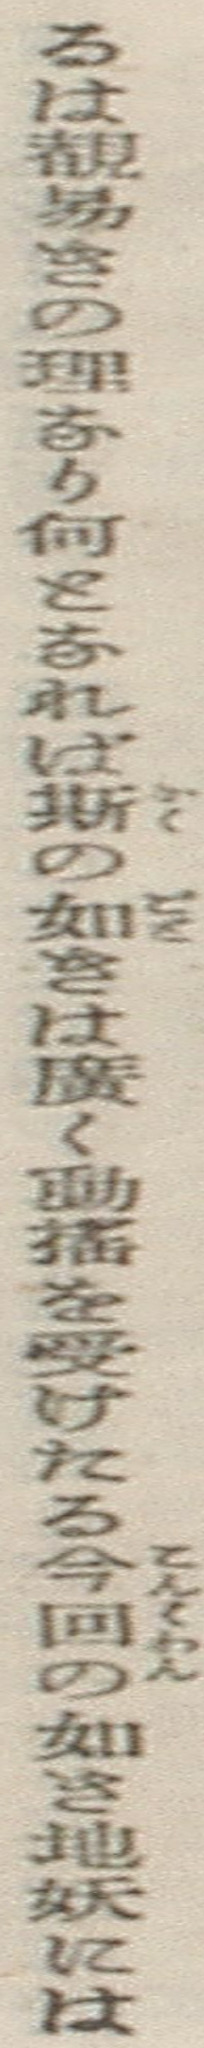るは覩易きの理なり何となれば斯の如きは広く動揺を受けたる今回の如き地妖には

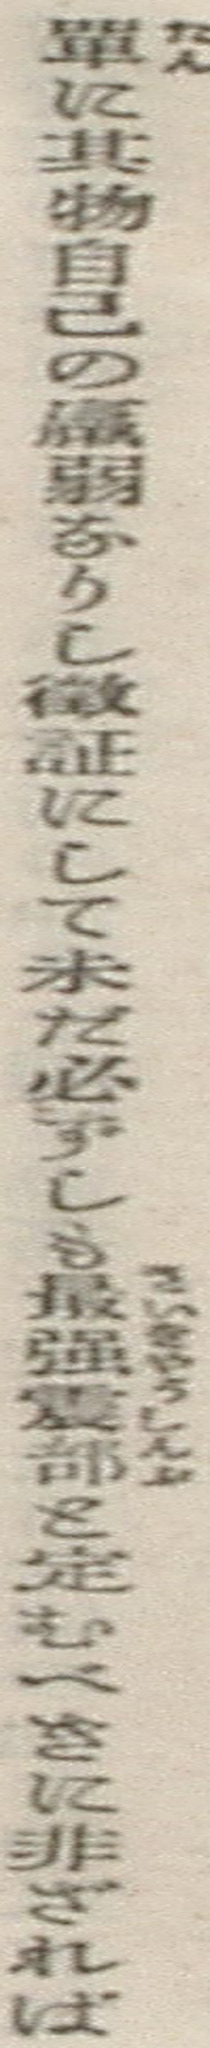単に其物自己の脆弱なりし微証にして未だ必ずしも最強震部と定むべきに非ざれば
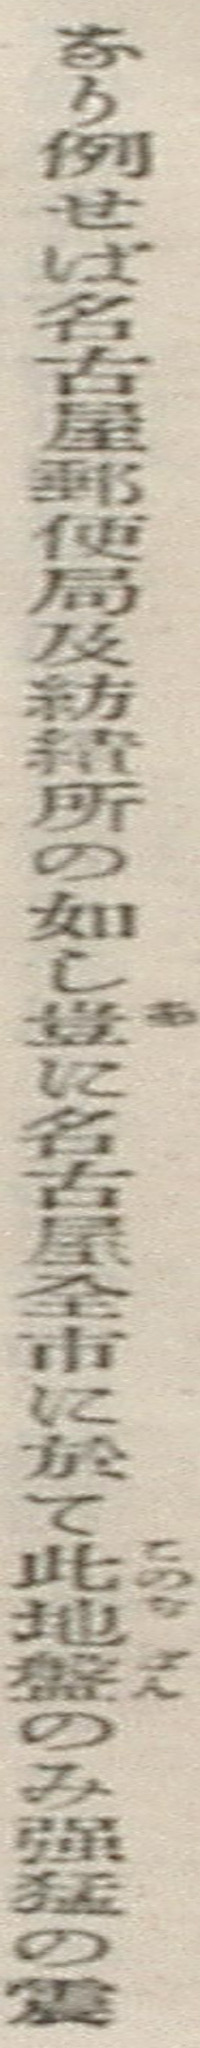なり例せば名古屋郵便局及紡績所の如し豈に名古屋全市に於て此地盤のみ強猛の震
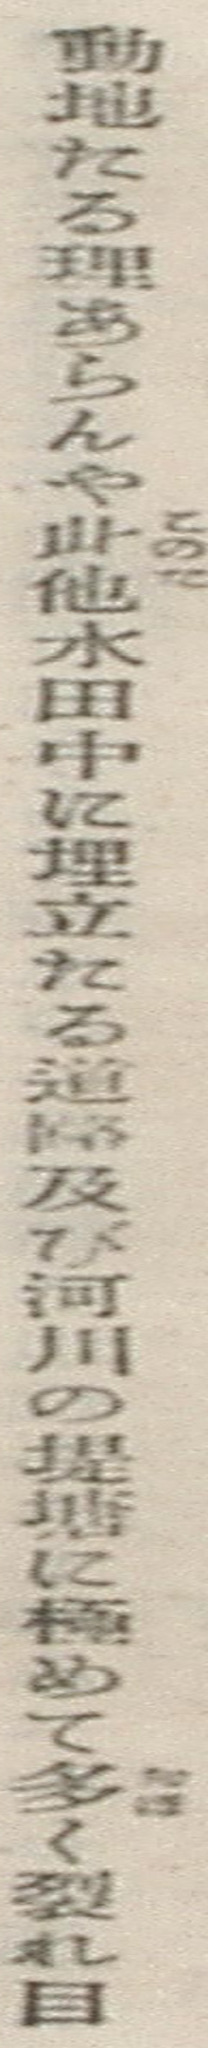動地たる理あらんや此他水田中に埋立たる道路及び河川の堤塘に極めて多く裂れ目
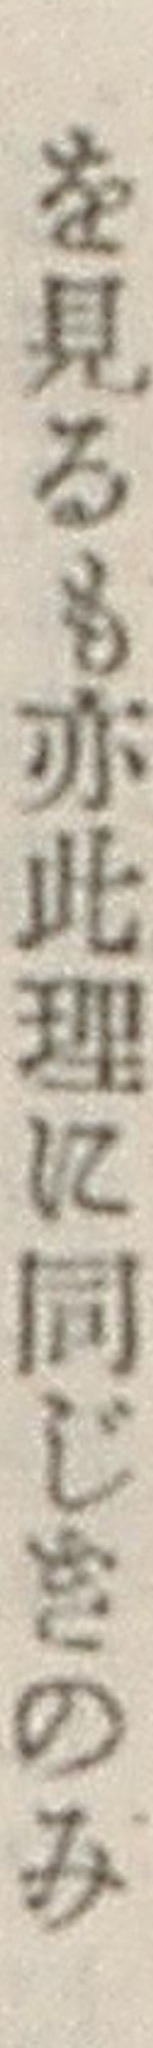を見るも亦此理に同じきのみ
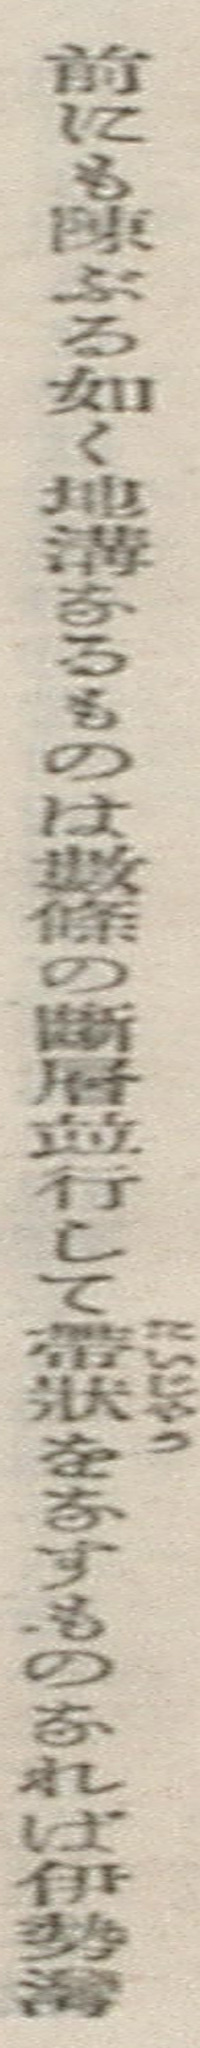前にも陳ぶる如く地溝なるものは数條の断層竝行して帯状をなすものなれば伊勢湾
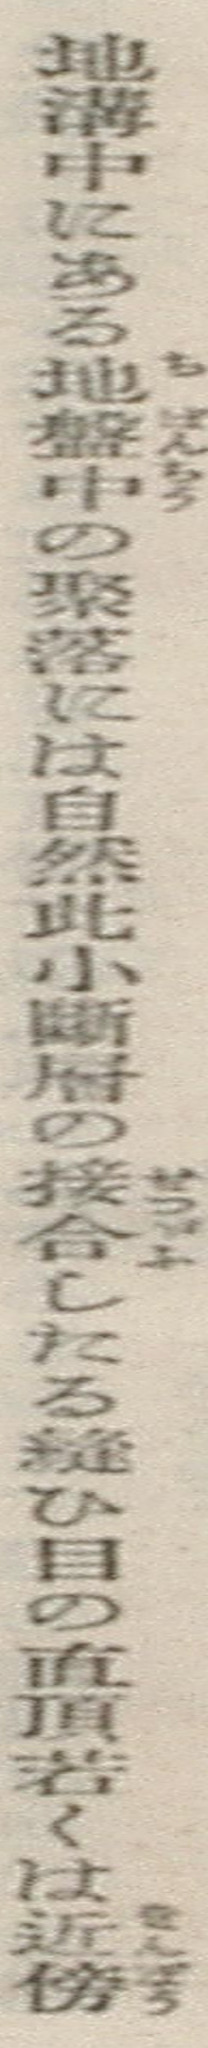地溝中にある地盤中の聚落には自然此小断層の接合したる縫ひ目の直頂若くは近傍
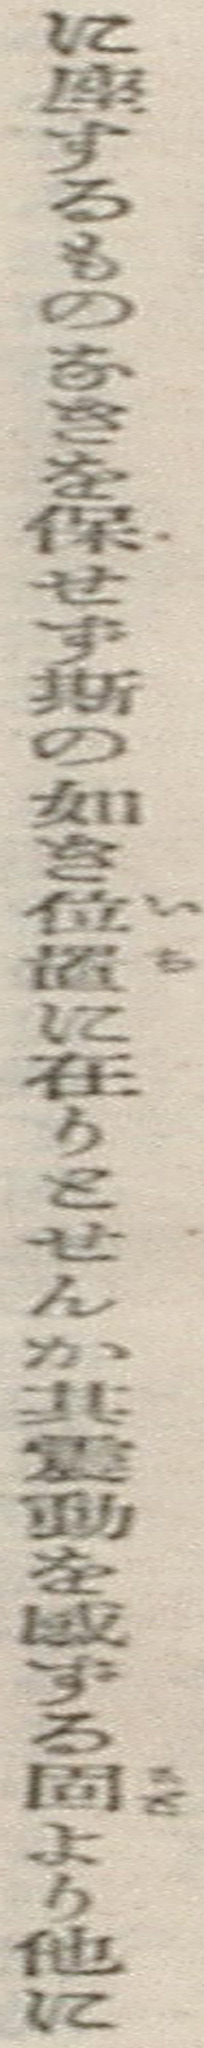に座するものなきを保せず斯の如き位置に在りとせんか其震動を感ずる固より他に
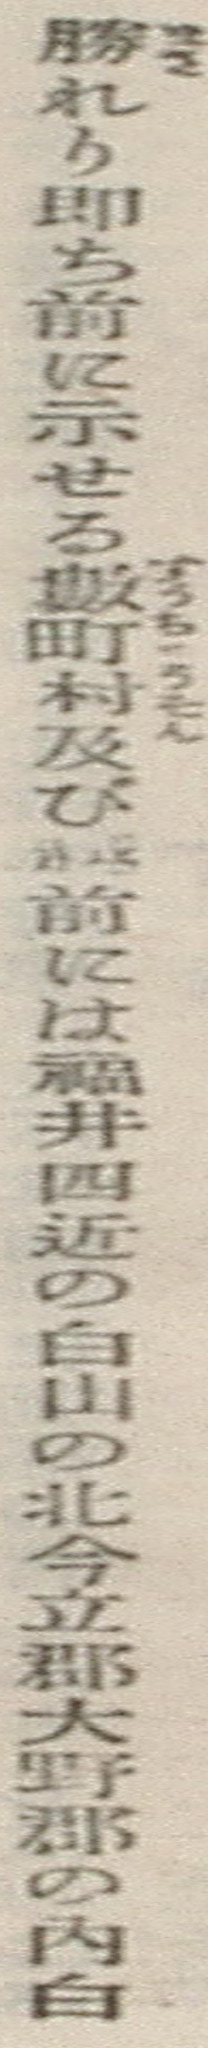勝れり即ち前に示せる数町村及び越前には福井四近の白山の北今立郡大野郡の内白
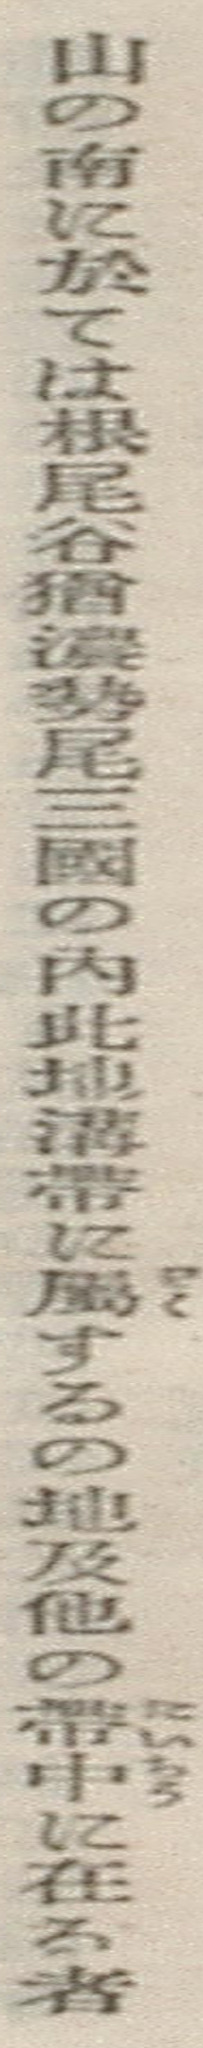山の南に於ては根尾谷猶濃勢尾三国の内此地溝帯に属するの地及他の帯中に在る者
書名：愛知岐阜福井三県　大地震見聞録（内題）
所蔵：東京大学地震研究所図書室 Earthquake Research Institute Library, The University of Tokyo, JAPAN
